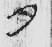月
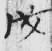戊
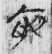寅
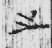之
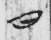日
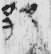○（鄖）
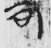司
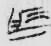馬
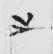之
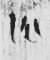州
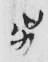加
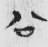公
